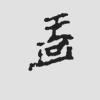盂
